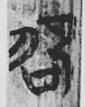卲（昭）
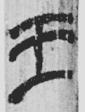王
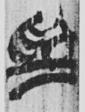爲
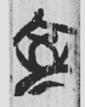室
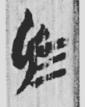於
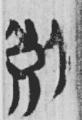死（夷）
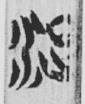{水疋}（沮）
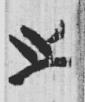之
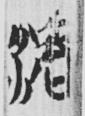○（滸）
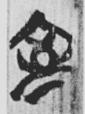室
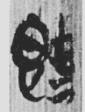既
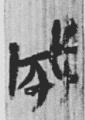成
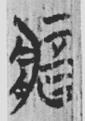𨟻（將）
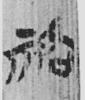{示各}（落）
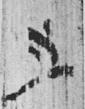之
